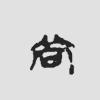尙
